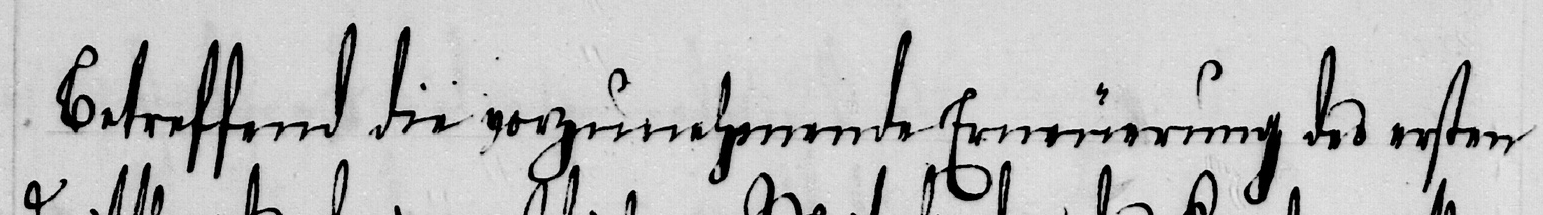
Betreffend die vorzunehmende Erneuerung des ersten
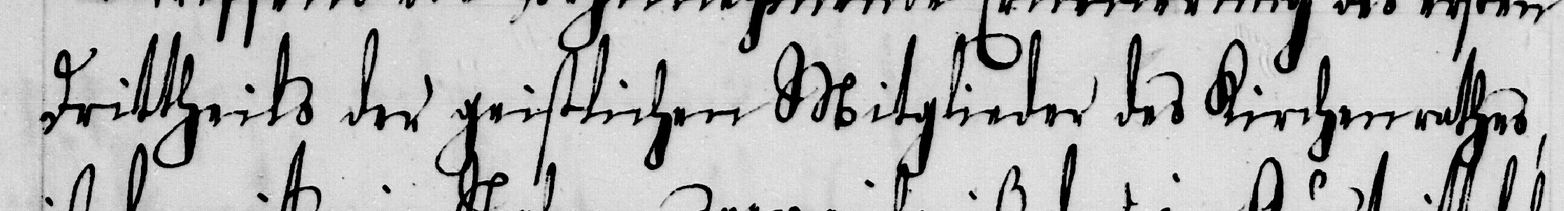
Drittheils der geistlichen Mitglieder des Kirchenrathes,
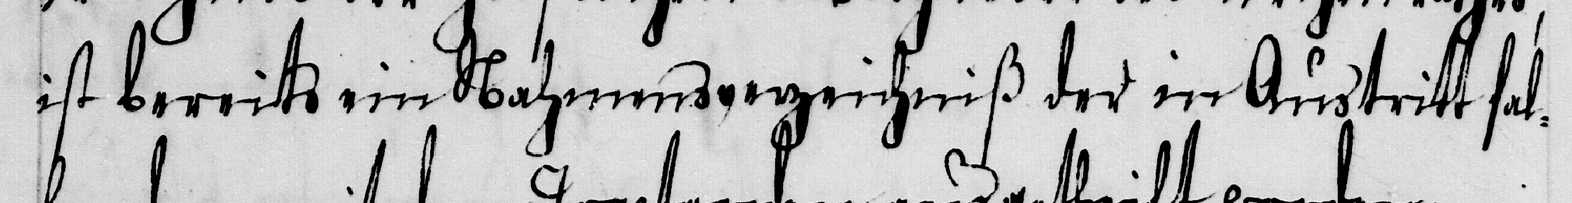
ist bereits ein Nahmensverzeichniß der in Austritt fal¬
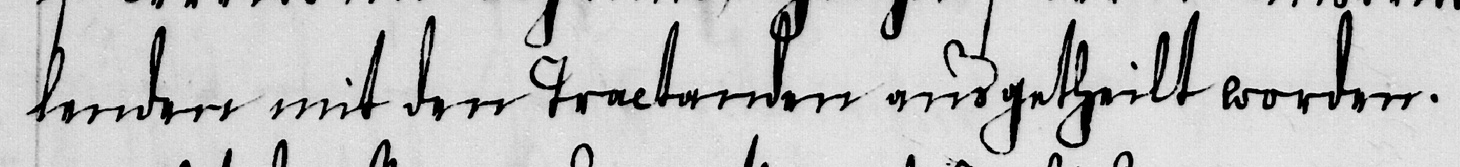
lenden mit den Tractanden ausgetheilt worden.
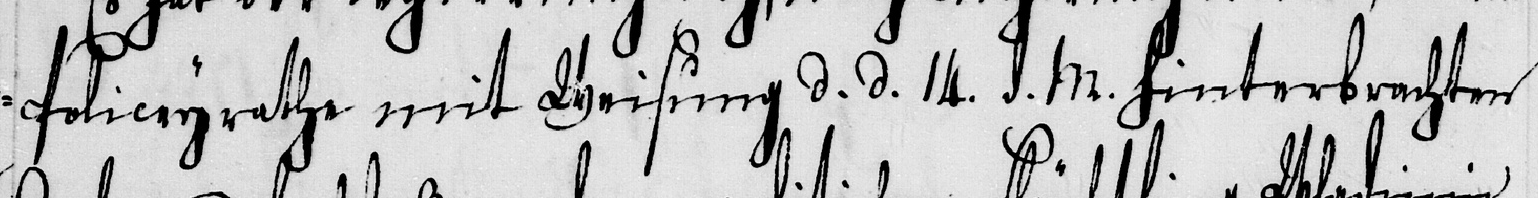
Policeyrathe mit Weisung d. d. 14. d. M. hinterbrachten
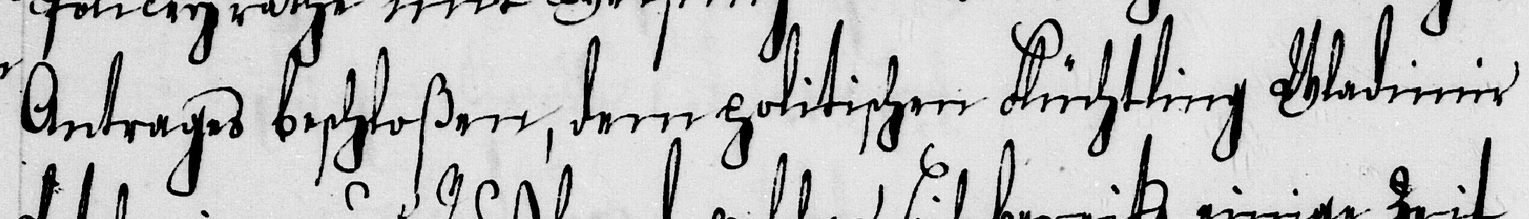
Antrages beschloßen, dem politischen Flüchtling Wladimir
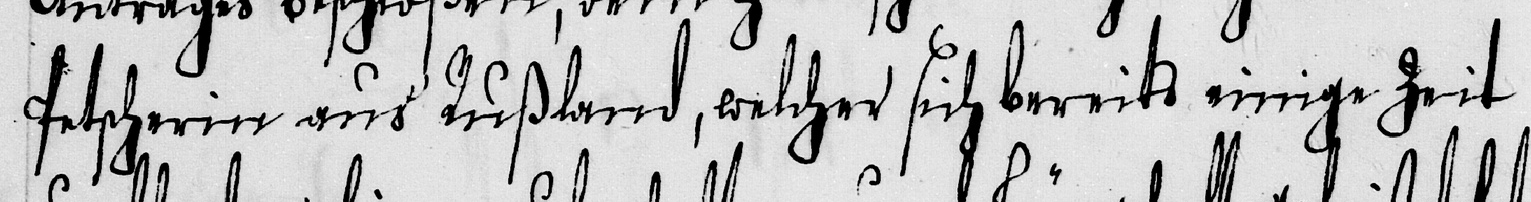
Petscherin aus Rußland, welcher sich bereits einige Zeit
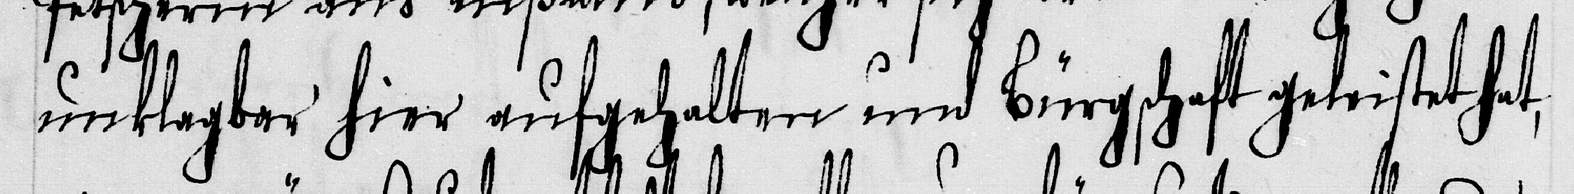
unklagbar hier aufgehalten und Bürgschaft geleistet hat,
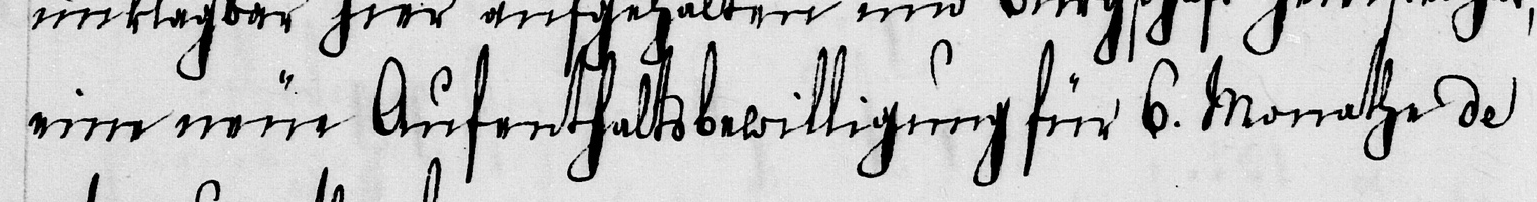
eine neue Aufenthaltsbewilligung für 6. Monathe de
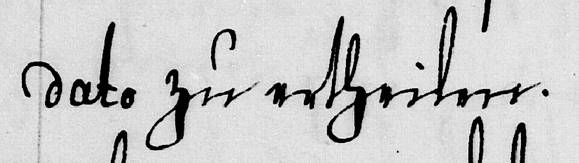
dato zu ertheilen.
